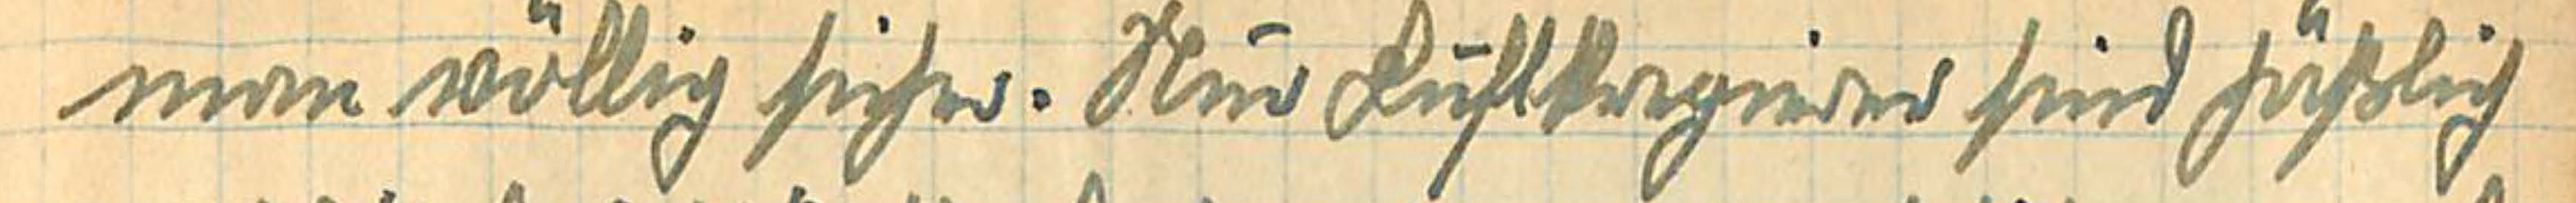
man völlig sicher. Nur Luftkrepierer sind häßlich
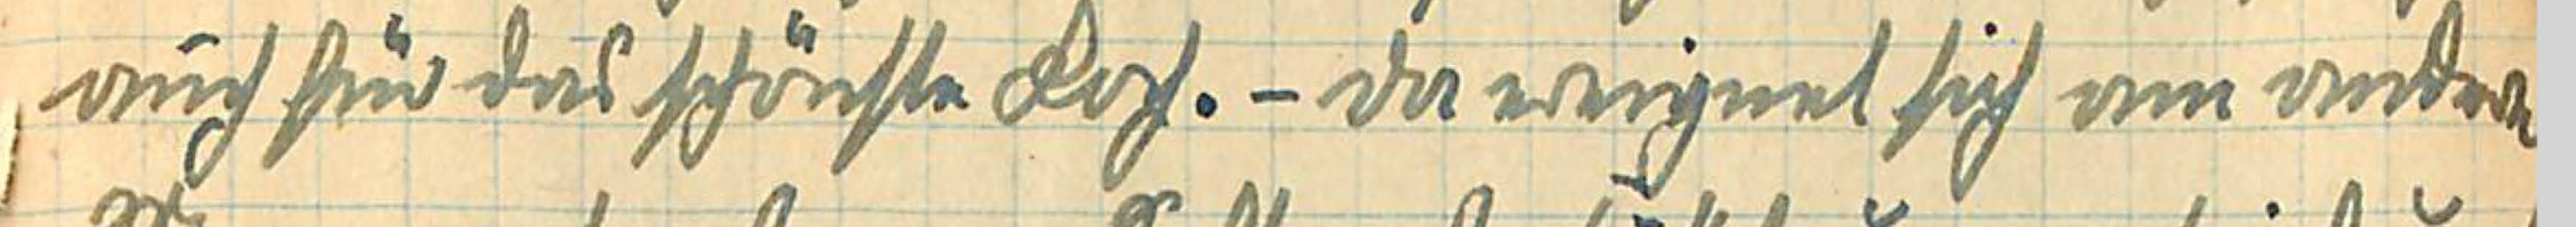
auch für das schönste Loch. – Da ereignet sich am anderen
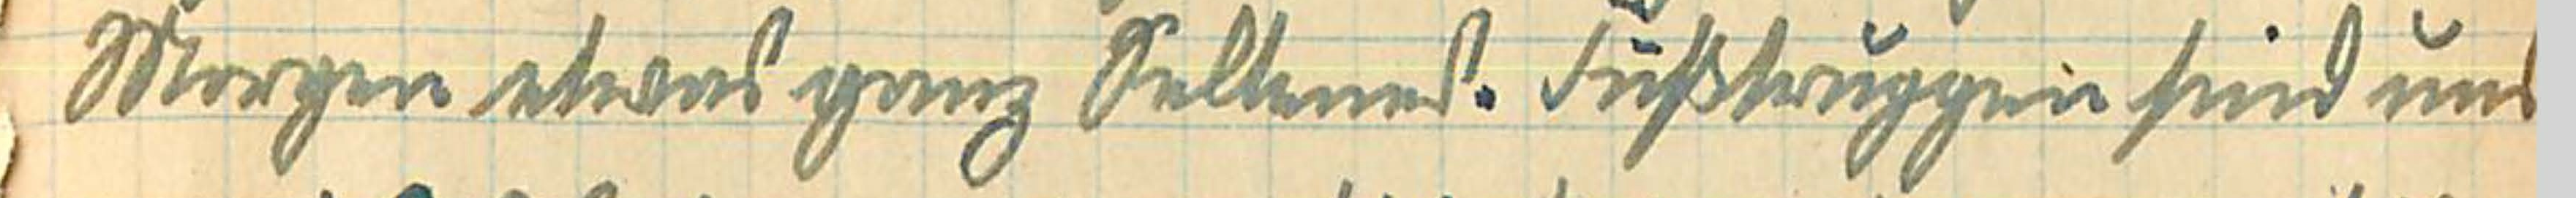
Morgen etwas ganz Seltenes. Fußtruppen sind uns
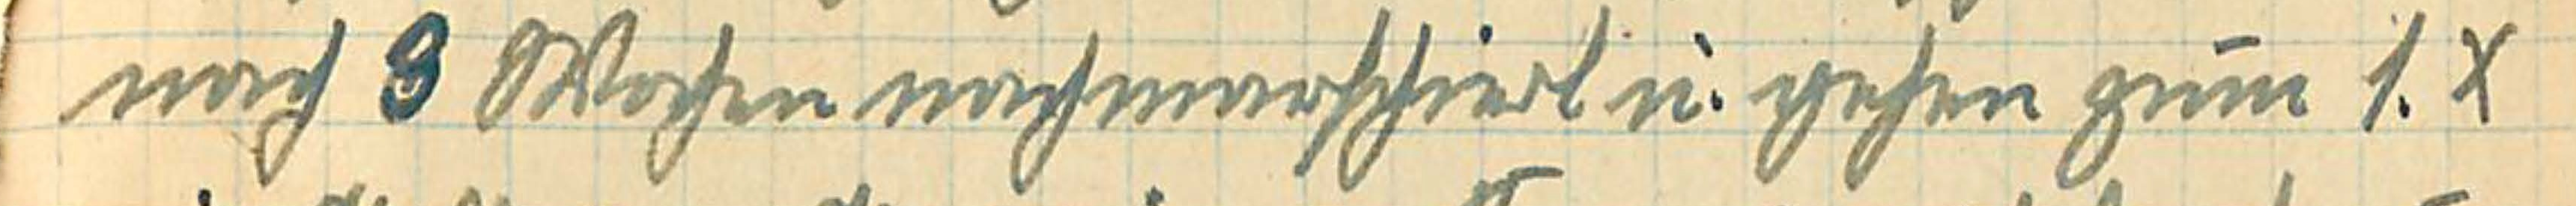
nach 3 Wochen nachmarschiert u. gehen zum 1.X
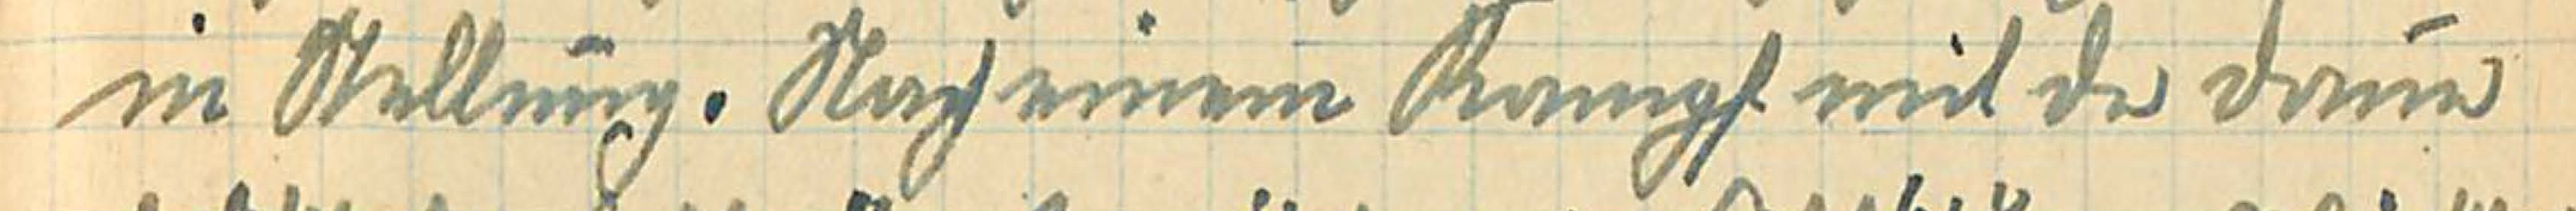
in Stellung. Nach einem Kampf mit der Dauer
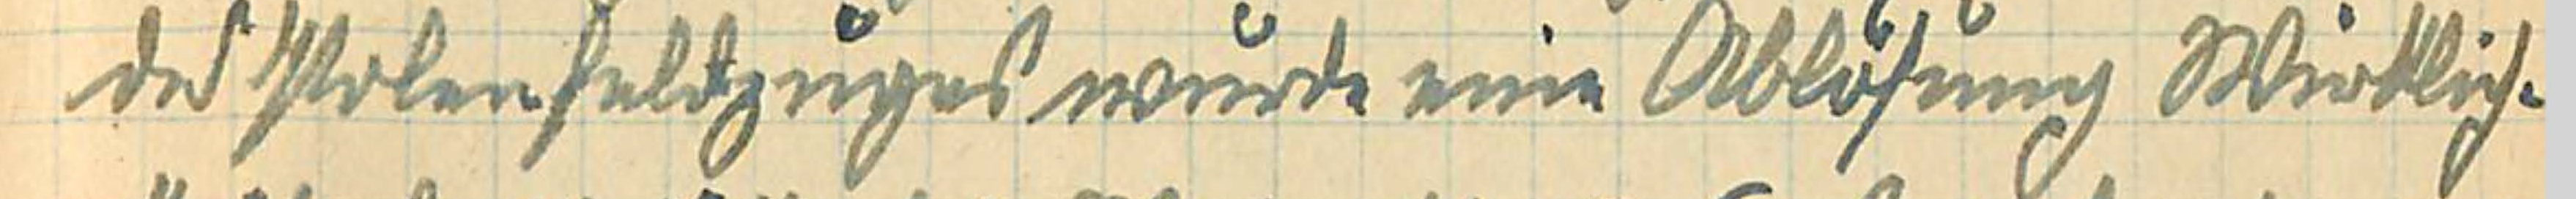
des Polenfeldzuges wurde eine Ablösung Wirklich-
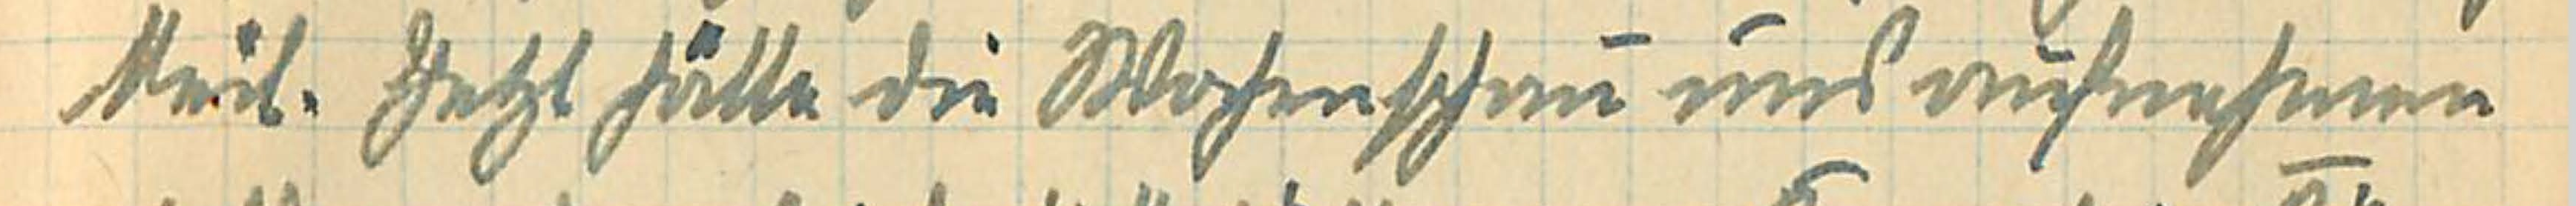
keit. Jetzt hätte die Wochenschau uns aufnehmen
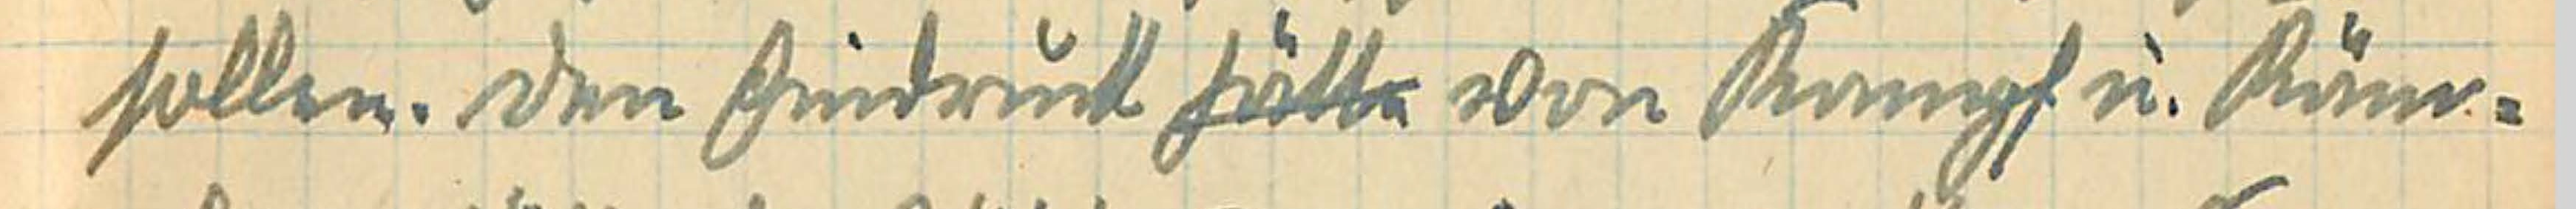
sollen. Den Eindruck hätte von Kampf u. Käm-
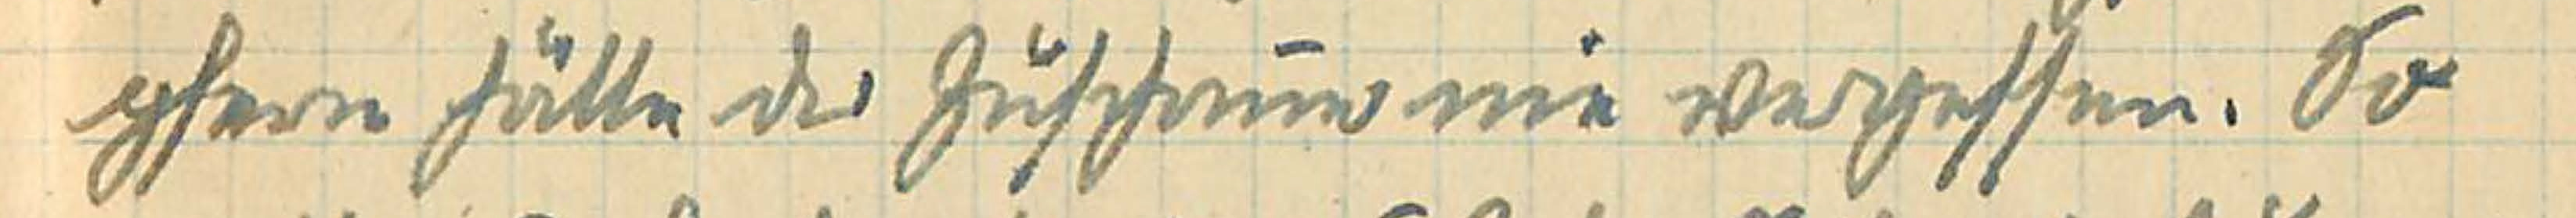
pfern hätte der Zuschauer nie vergessen. So
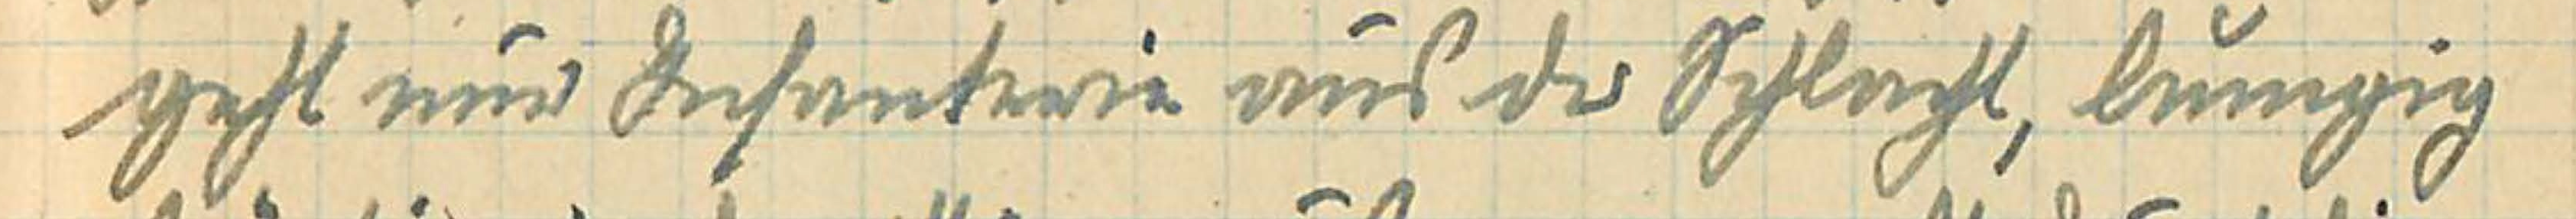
geht nur Infanterie aus der Schlacht, lumpig
